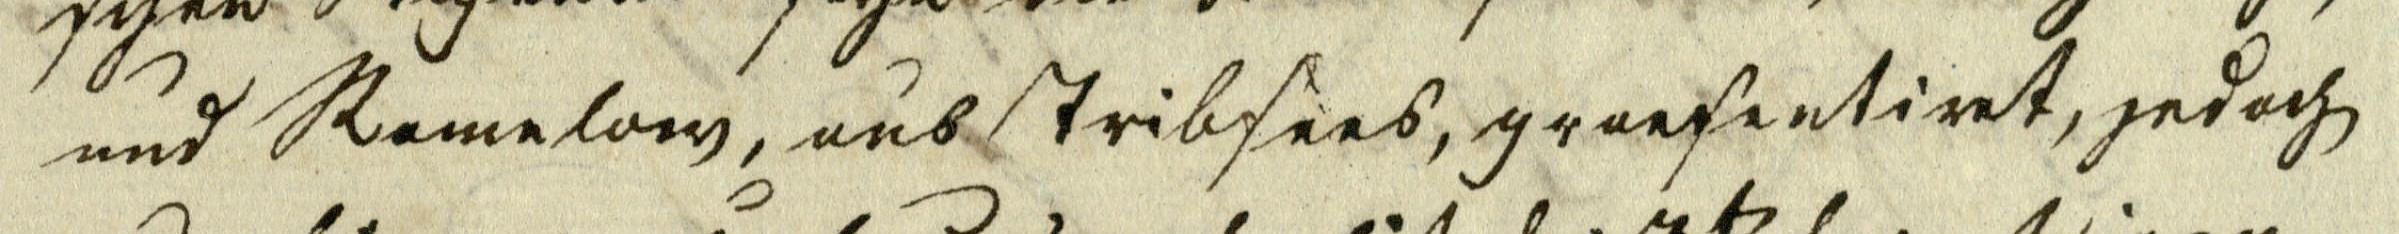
und Ramelow, aus Tribsees, praesentiret, jedoch
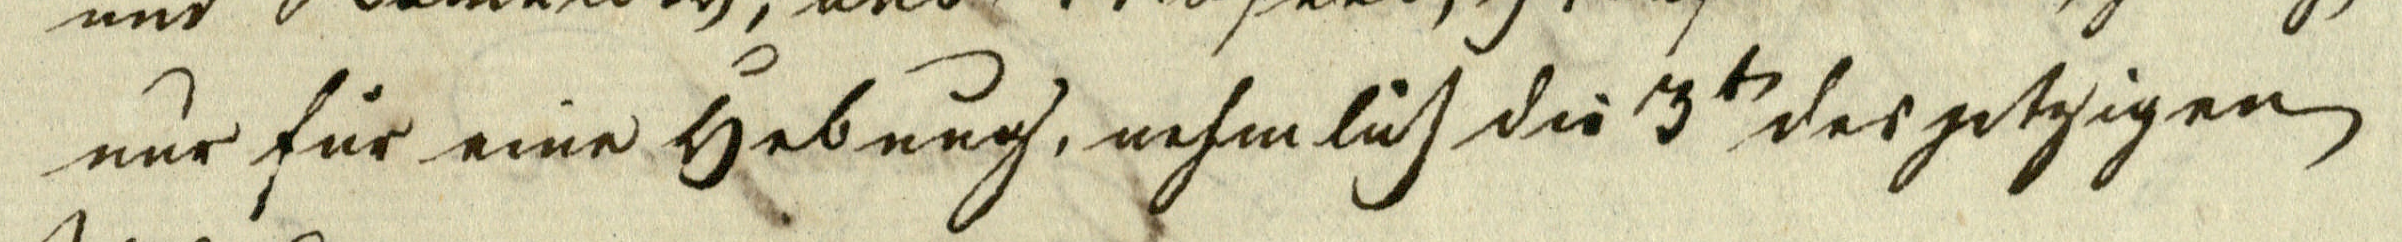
nur für eine Hebung, nehmlich die 3te des jetzigen
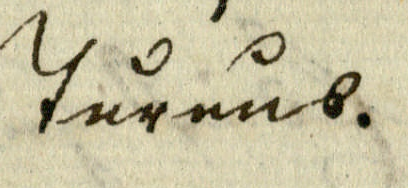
Turnus.
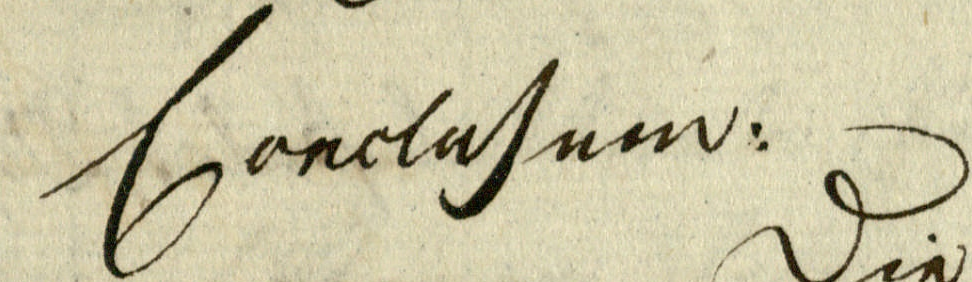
Conclusum:
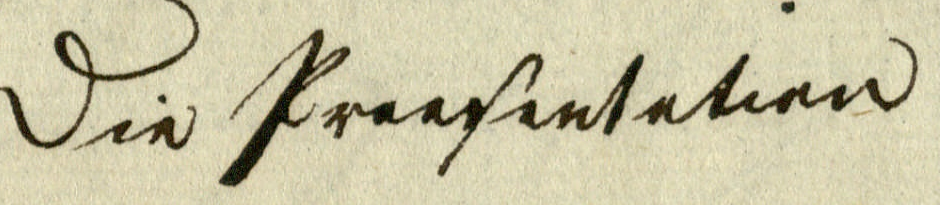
Die Praesentation
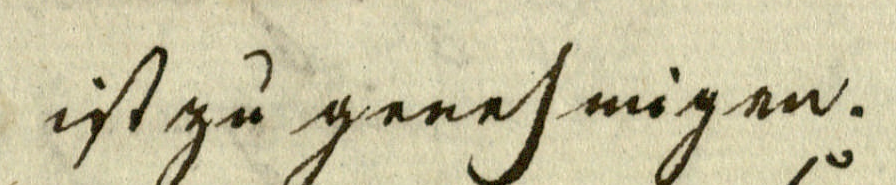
ist zu genehmigen.
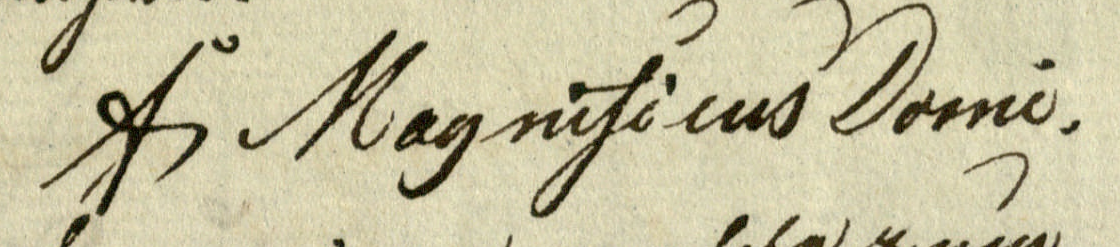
f, Magnificus Domi¬
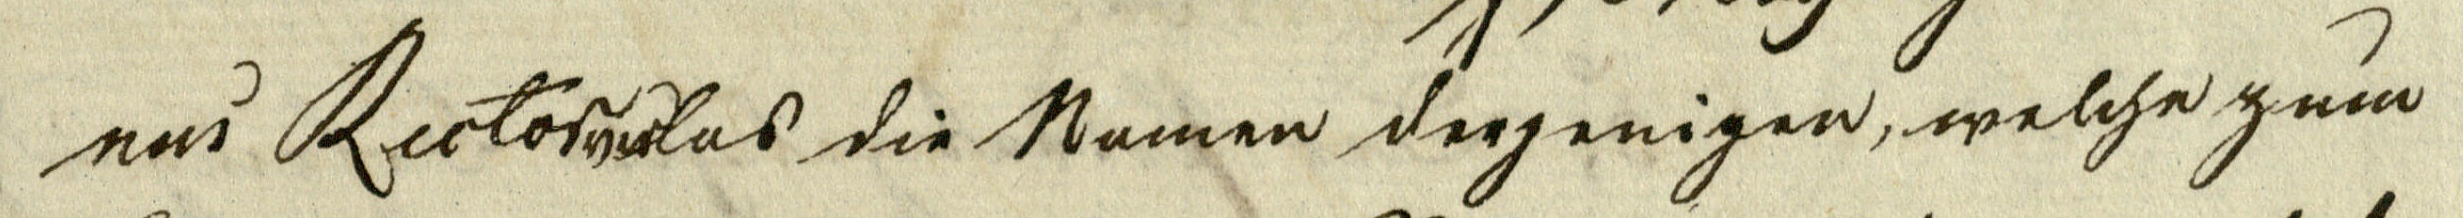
nus Rector verlas die Namen derjenigen, welche zum
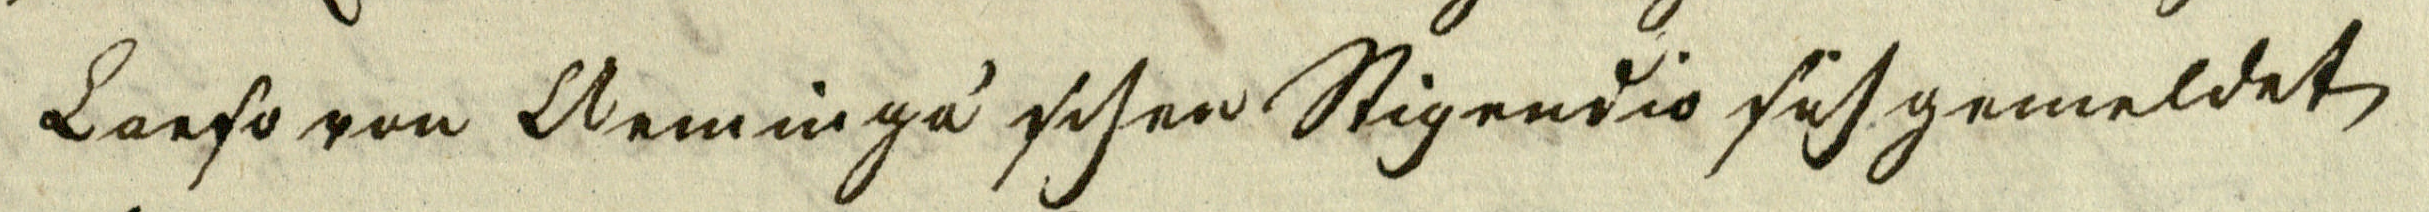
Caeso von Aeminga'schen Stipendio sich gemeldet
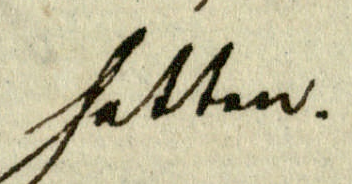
hatten.
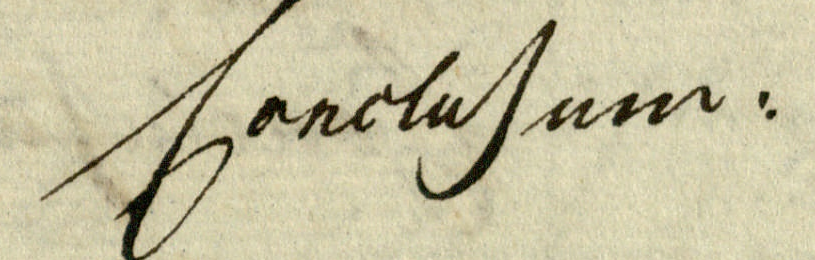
Conclusum:
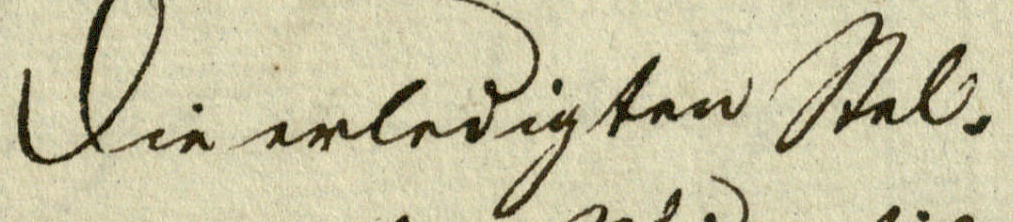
Die erledigten Stel¬
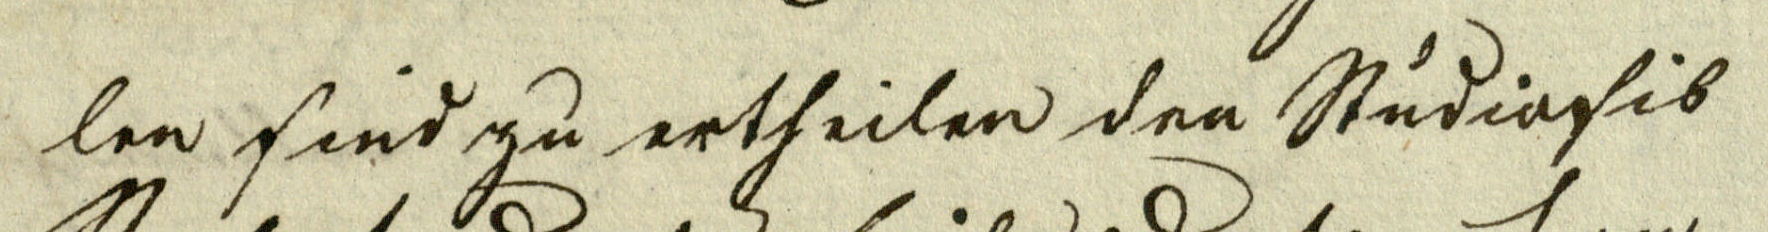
len sind zu ertheilen den Studiosis
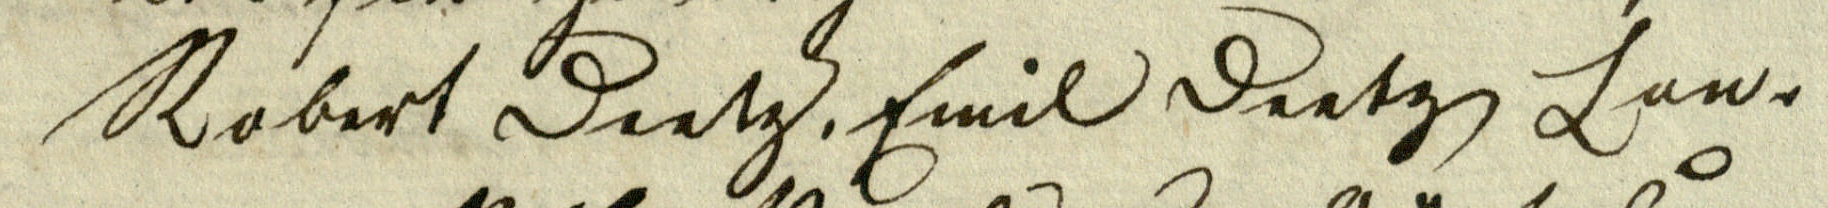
Robert Deetz, Emil Deetz, Lan¬
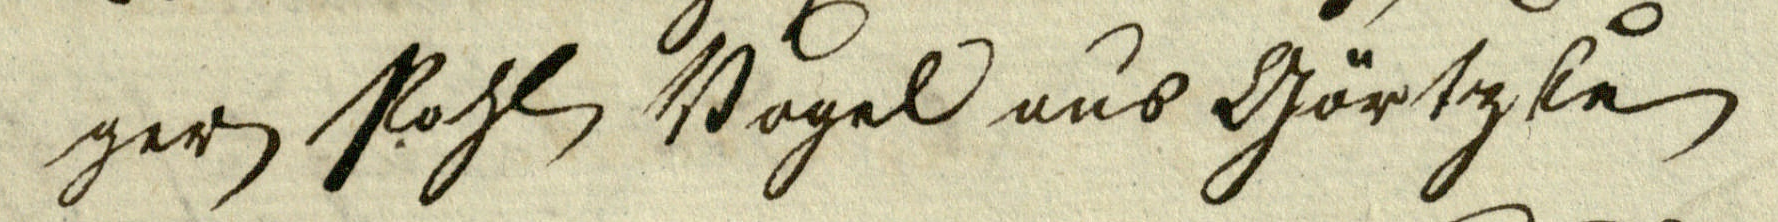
ger, Pohl, Vogel aus Görtzke
